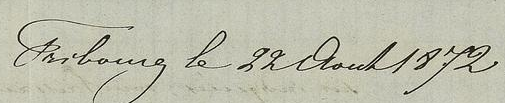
Fribourg le 22 Aout 1872.
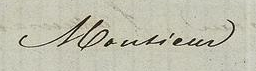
Monsieur
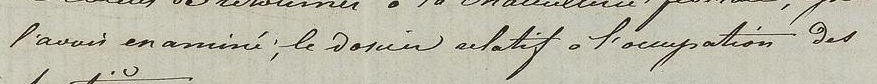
l'avoir examiné, le dossier relatif à l'occupation des
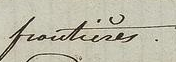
frontières.
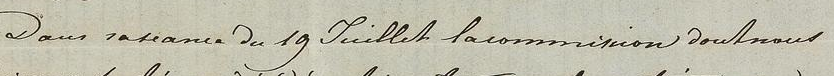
Dans sa séance du 19 Juillet la commission dont nous
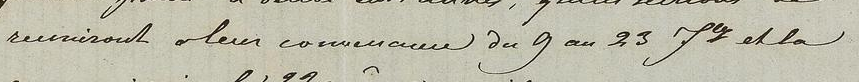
reuniront à leur convenance du 9 au 23 7bre et la
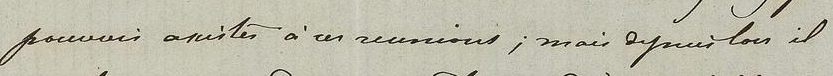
pouvoir assister à ces reunions; mais depuis lors il
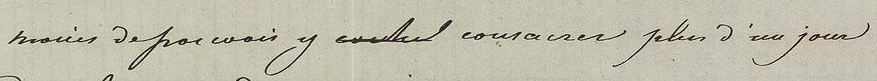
moins de pouvoir y coute consacrer plus d'un jour
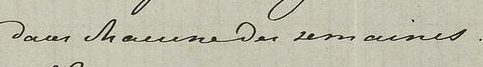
dans chacune des semaines.
